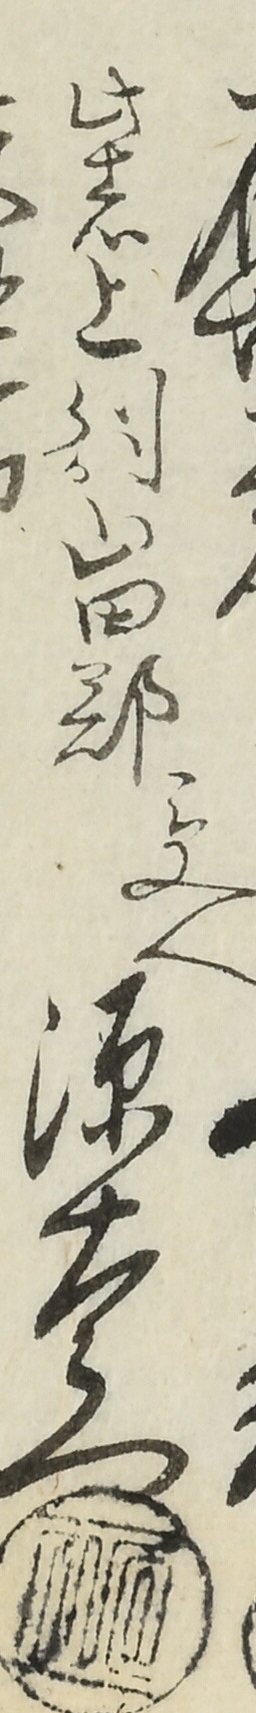此者上州山田郡受人源右衛門印
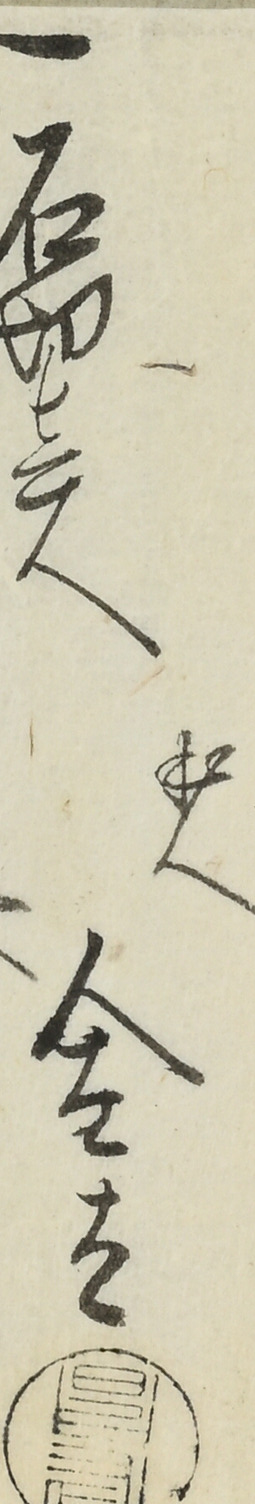一石切壱人本人金太印
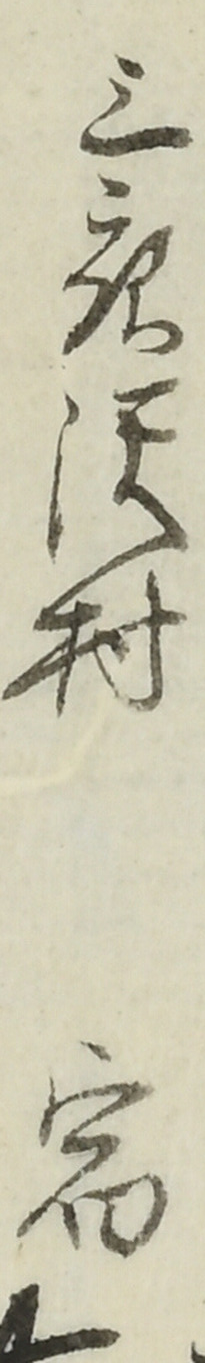三夜沢村宿

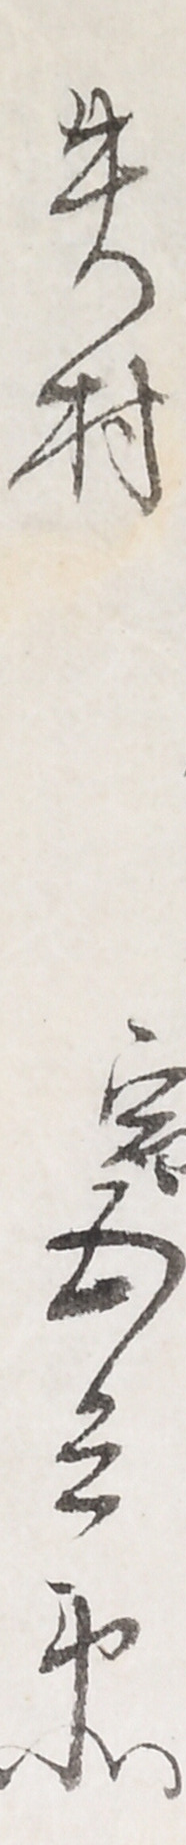失村宿五兵衛
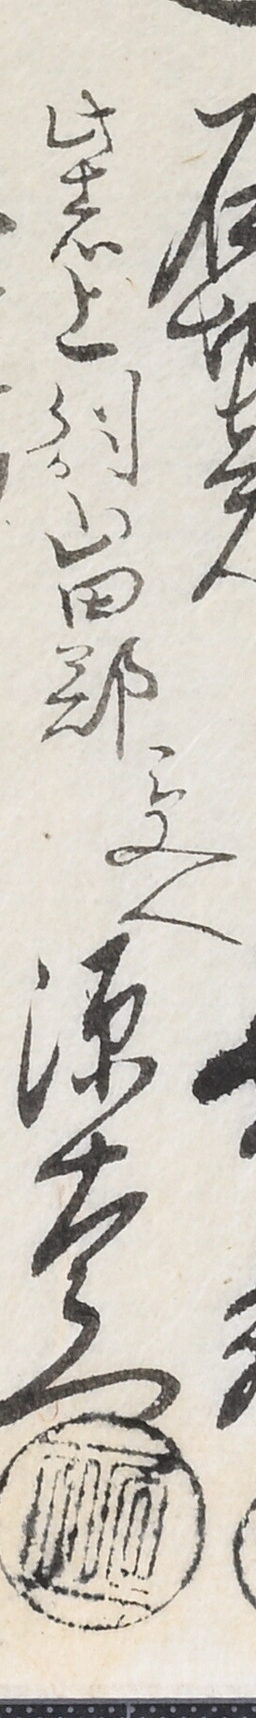此者上州山田郡受人源右衛門印
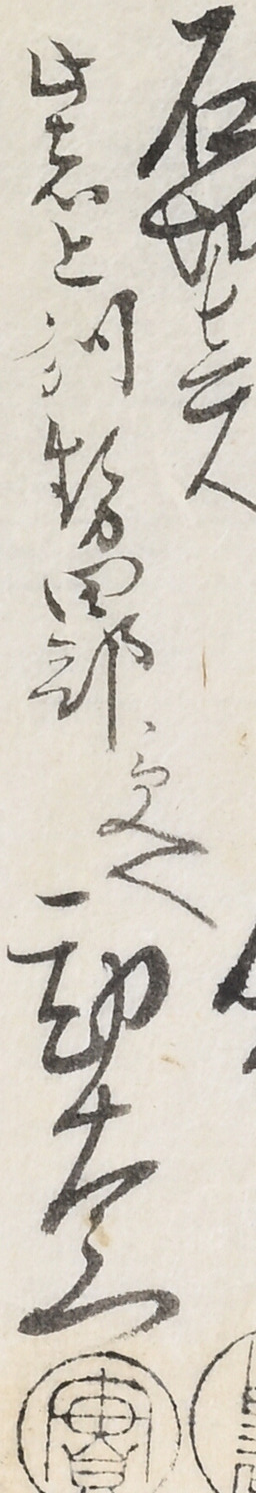此者上州勢田郡受人勘右衛門印
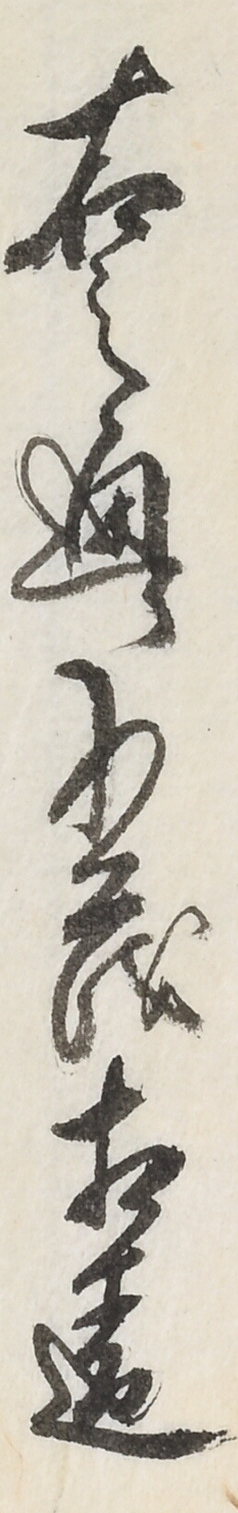右之通り少も相違
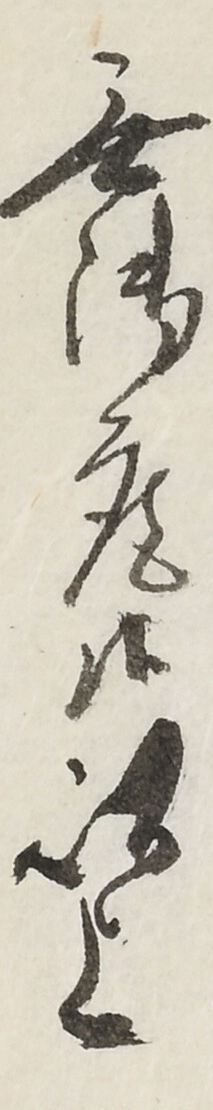無御座候以上
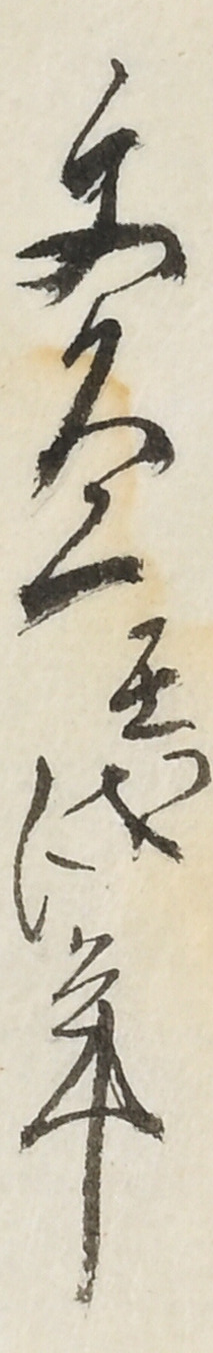文久ニ壬戌年
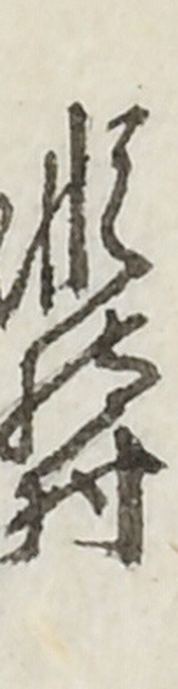非持村

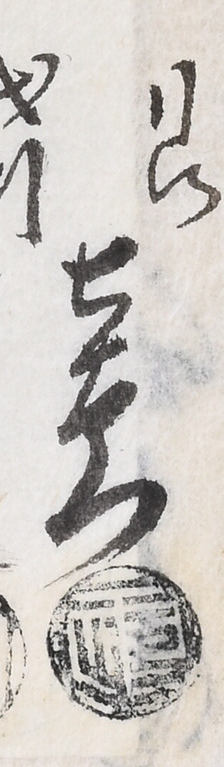七右衛門印
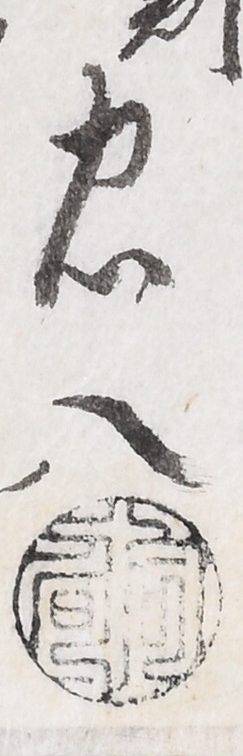忠八印
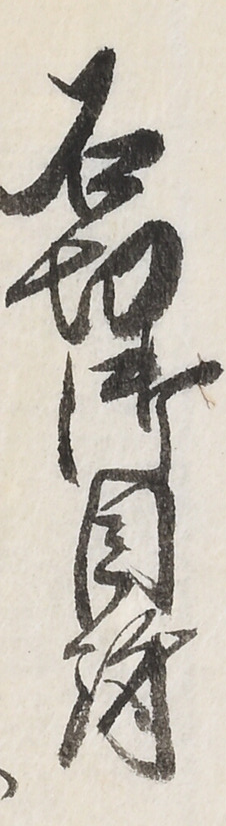石切御目附
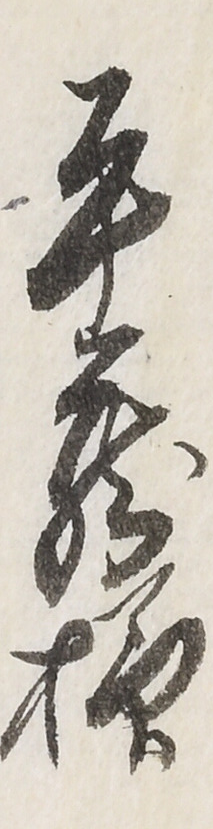平蔵様
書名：文久二壬戌年正月石切名前書上帳
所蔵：伊那市立高遠町図書館・合同会社AMANE
